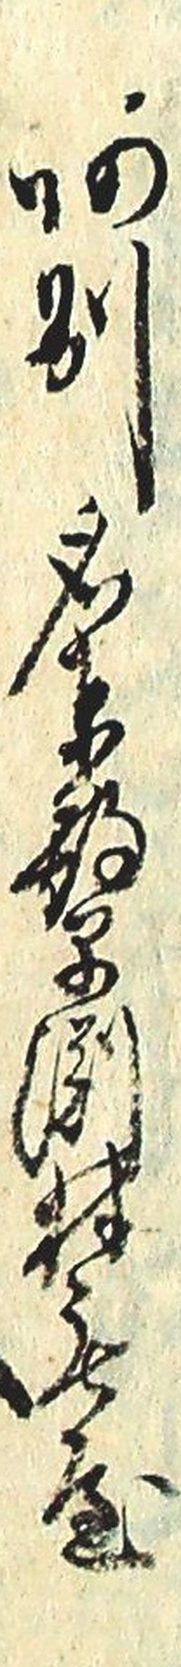阿州名東郡早淵村庄屋
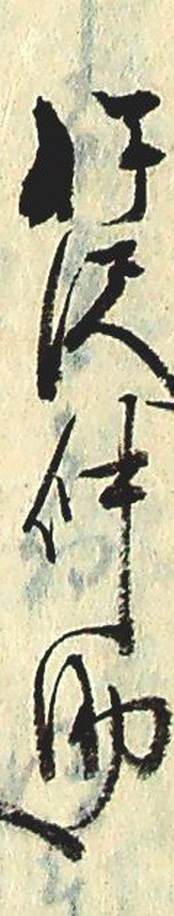伊沢仲助
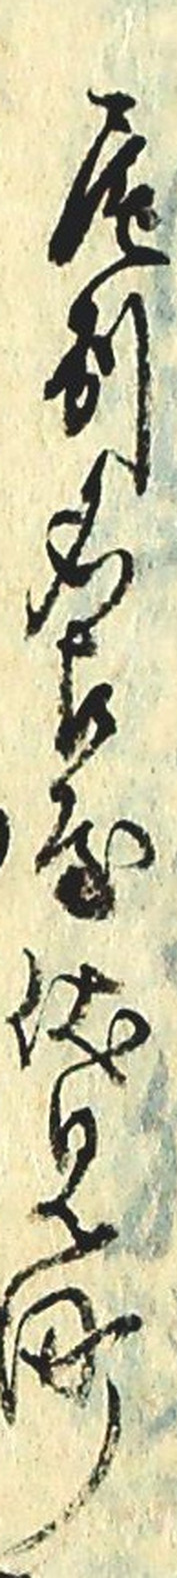尾州名古屋伏見町
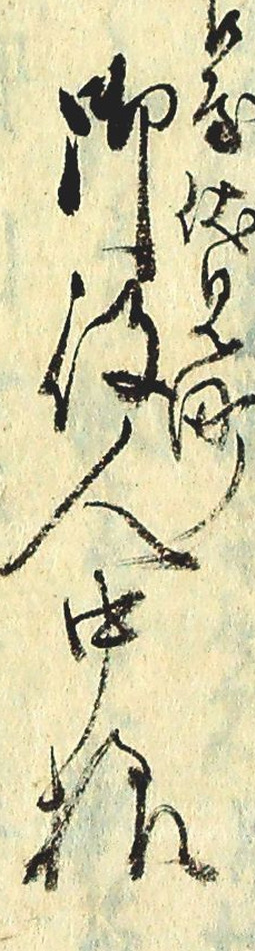御役人中様
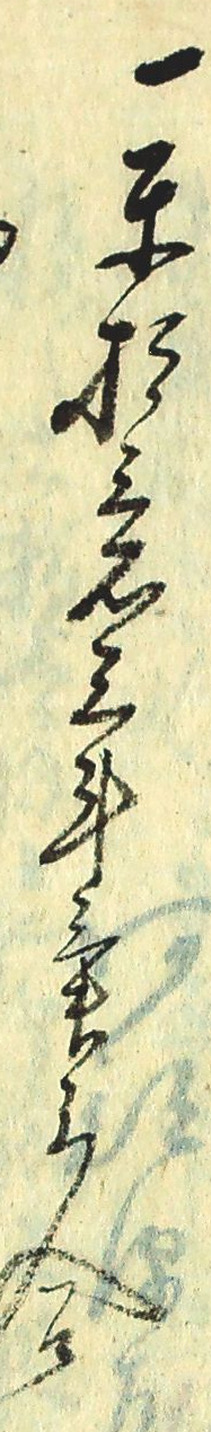一米拾三石三斗三升三合
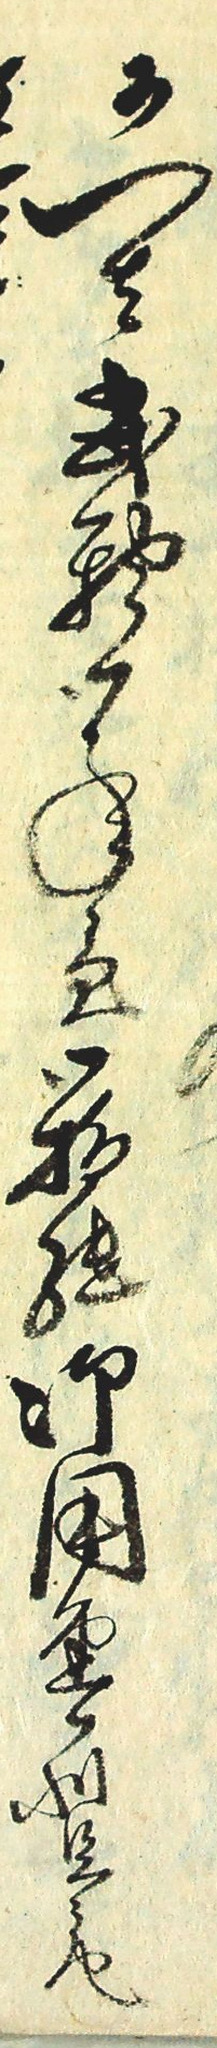右は当秋御年貢御指継御用金御利足之内へ
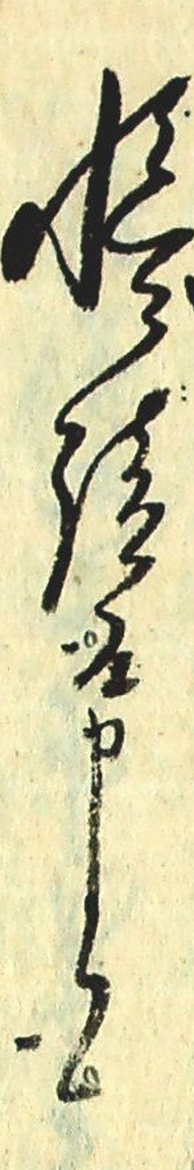慥に請取申候以上
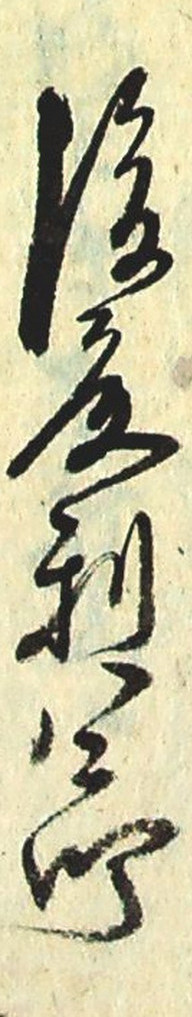後藤利八郎
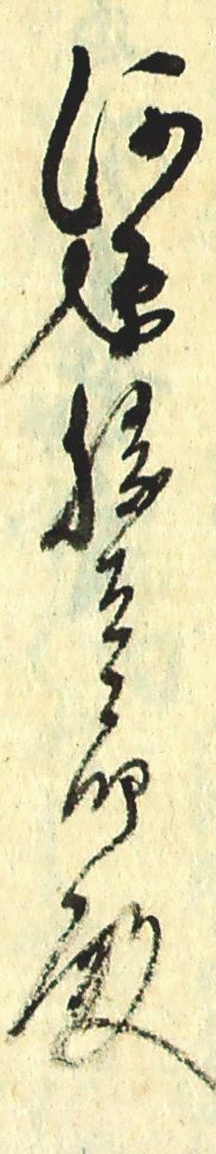河原勝太郎殿

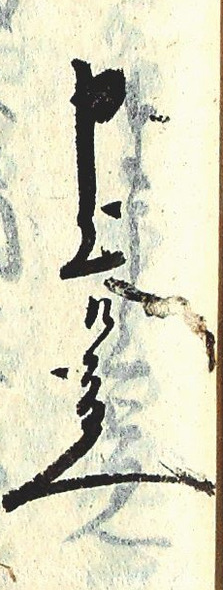申上る覚
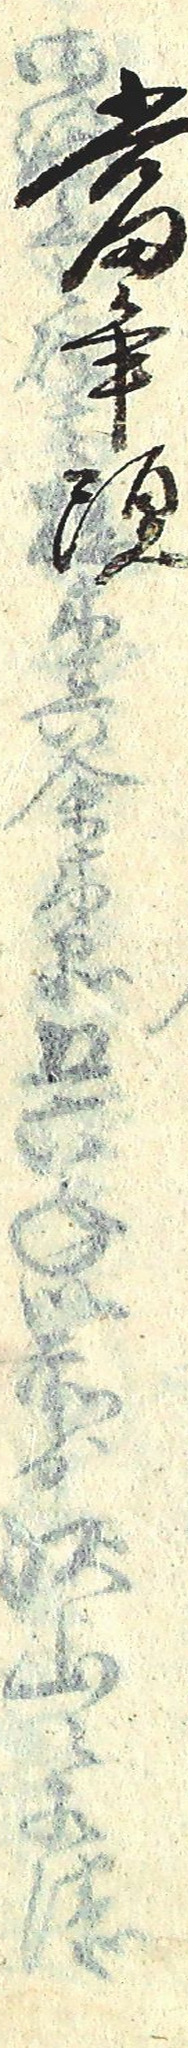当年頭
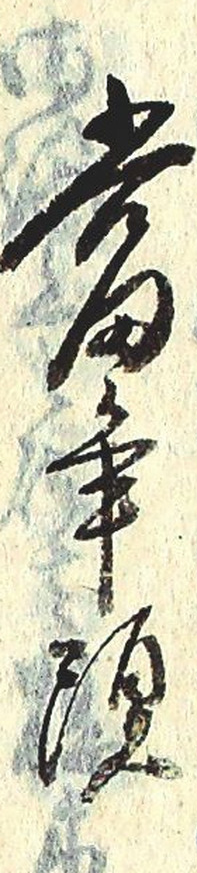当年頭
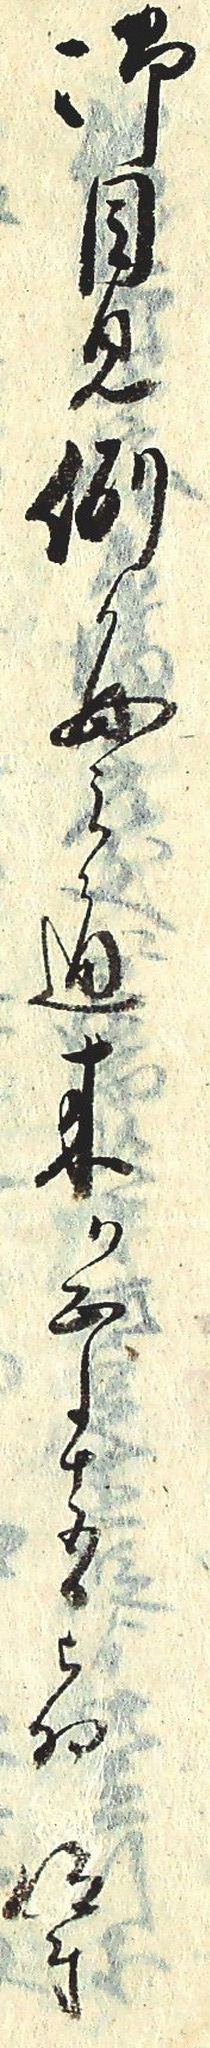御目見例毎之通来る正月十五日被為仰付
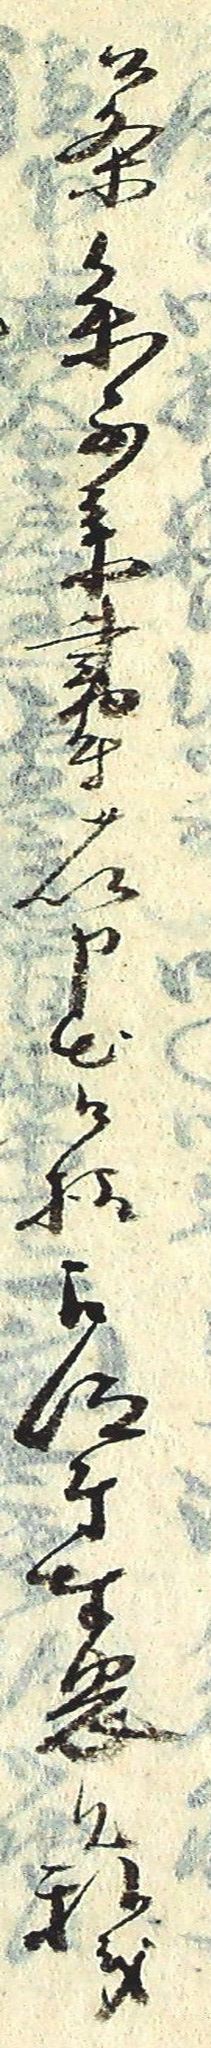候条参不参書付を以申出候様被仰付奉畏候私義
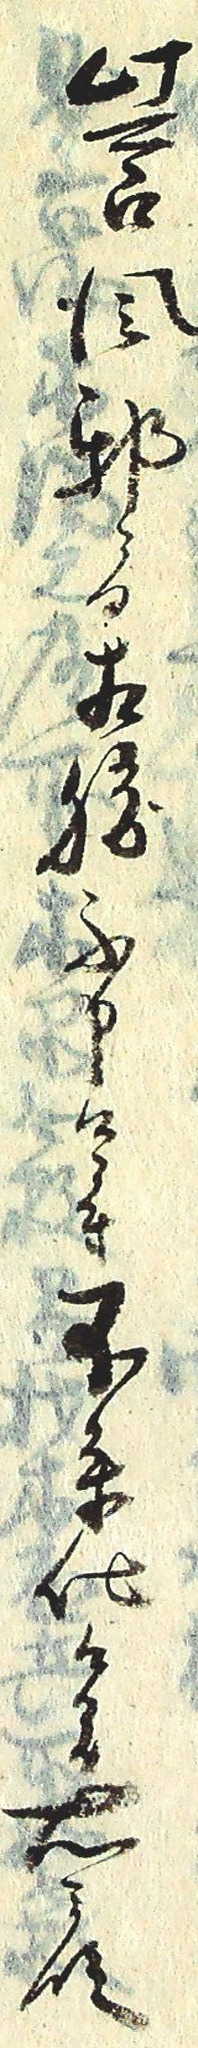此節風邪にて相勝不申候に付不参仕候間右之段
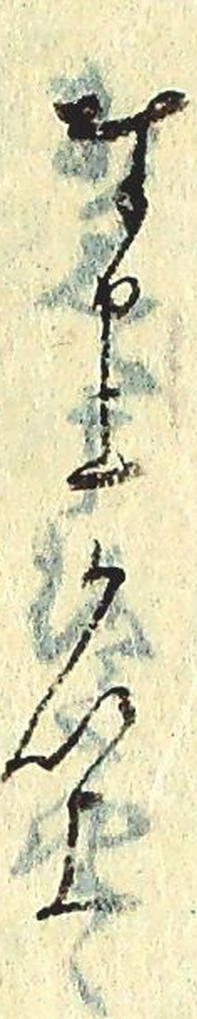奉申上候以上
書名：諸御願書控(弐番）
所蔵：鳴門教育大学 Naruto University of Education
